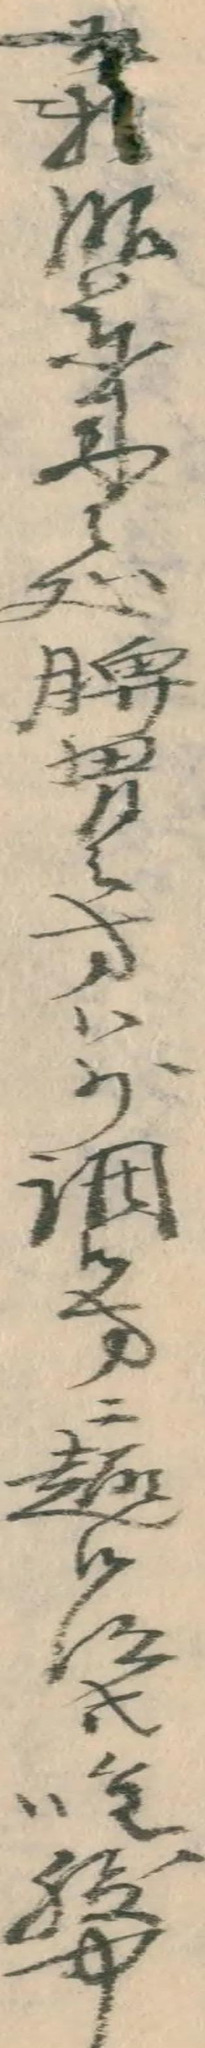相頼昨日之処脾胃之方ハ少調候方ニ趣候得共唯腹中

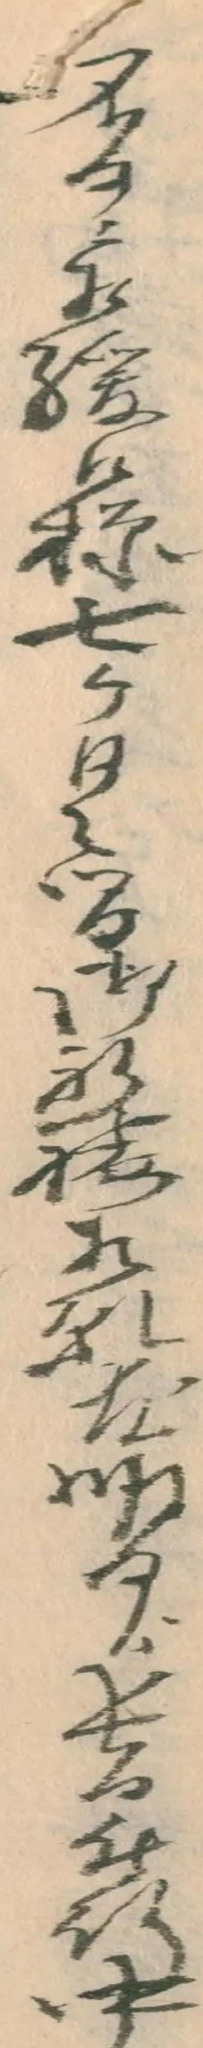不日ニ相緩候様七ヶ日之間御祈祷相願尤明日ゟ長日付行中
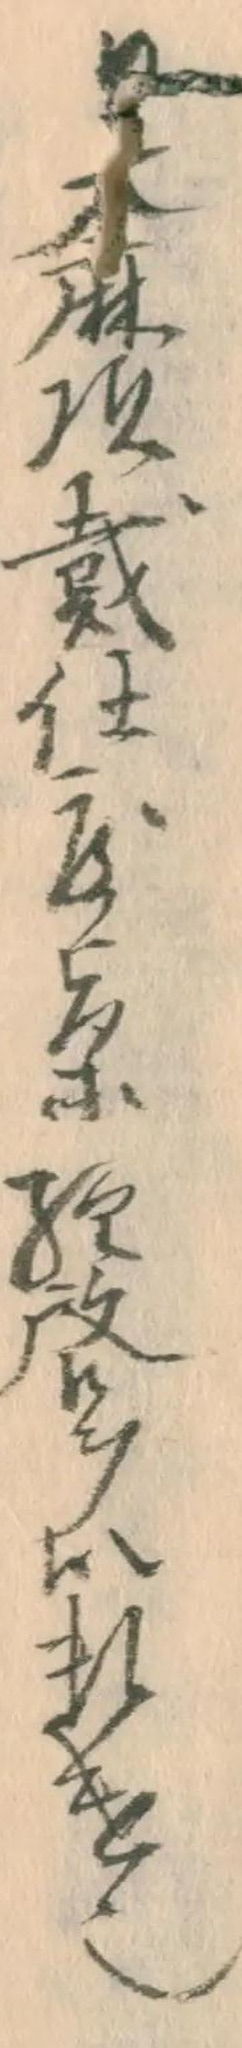日大麻頂戴仕度旨等経啓ヲ以頼遣也
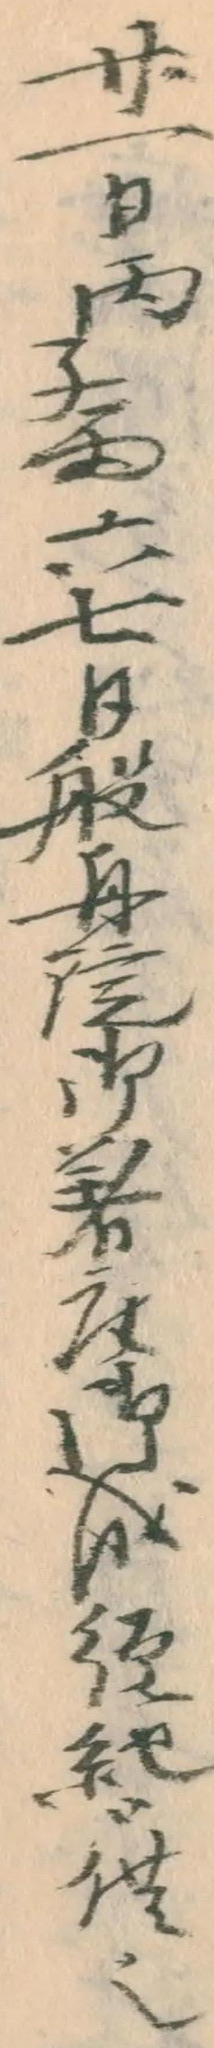廿一日丙子雨六七日般舟院御着座御成経紀御供也
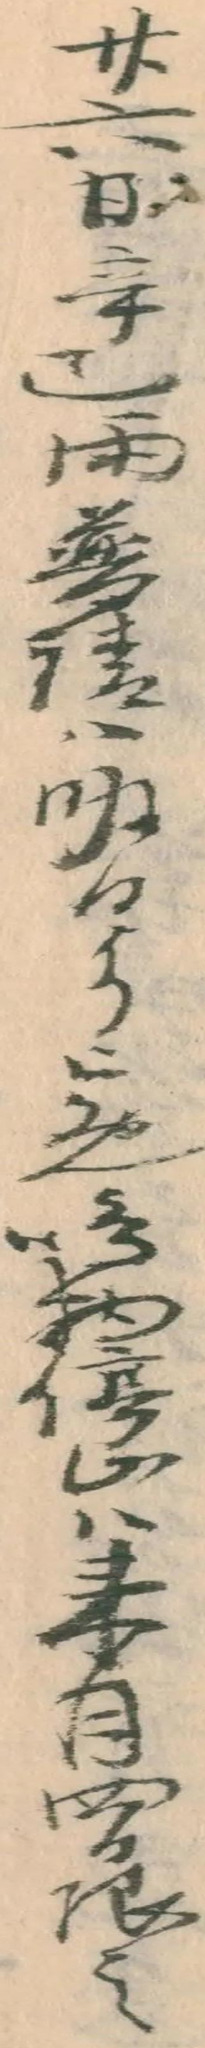廿六日辛巳雨普請ハ明日より被免鳴物停止ハ来月四日限之
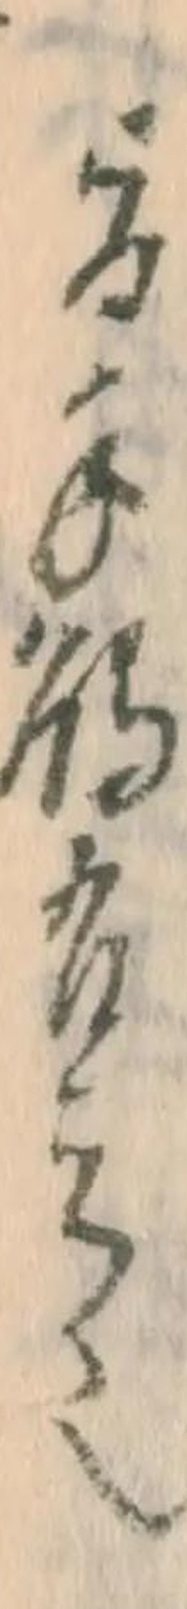旨手觸有之也
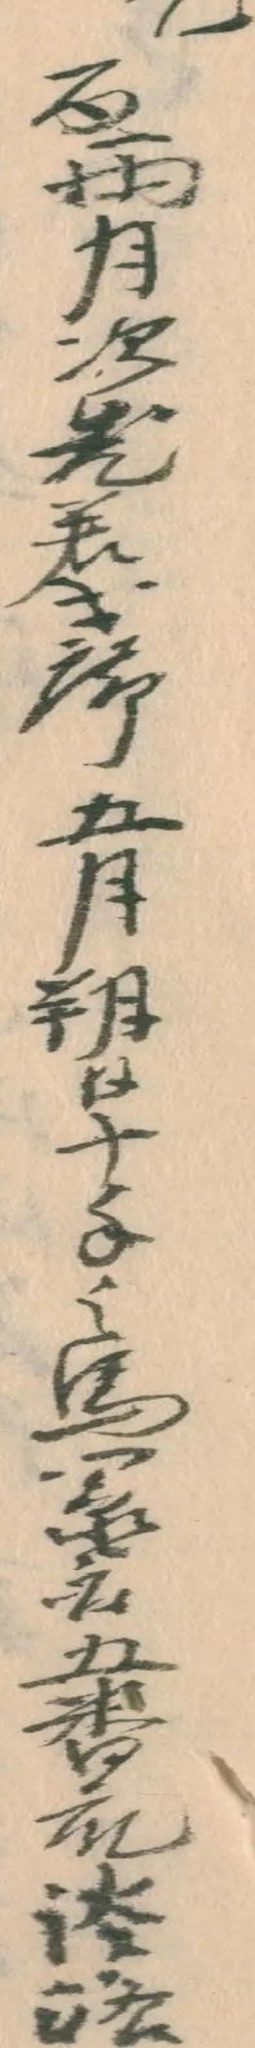晦日乙酉雨月次老若出席五月朔日十手之馬鬮取五番衆淡路
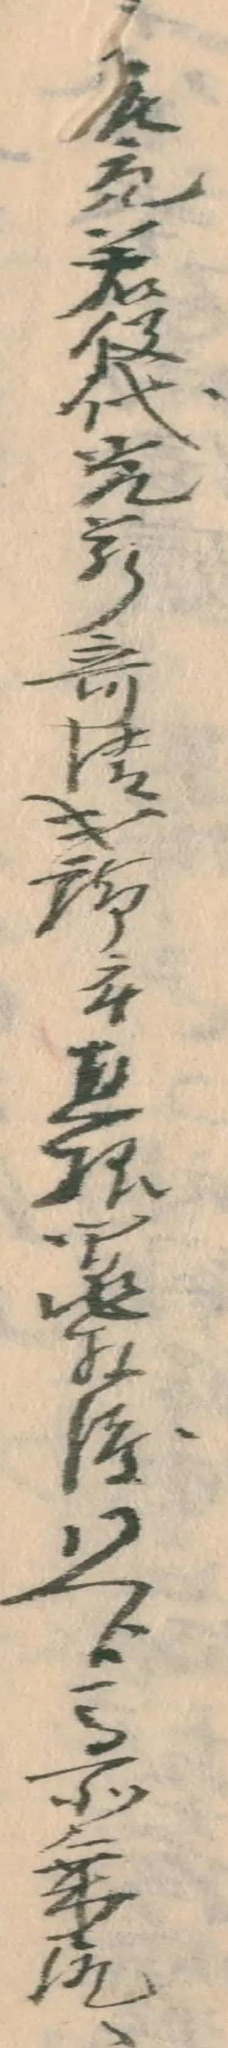宛若役代光蔵奇清出席ニ付直様鬮取後同人ゟ馬所乗尻へ
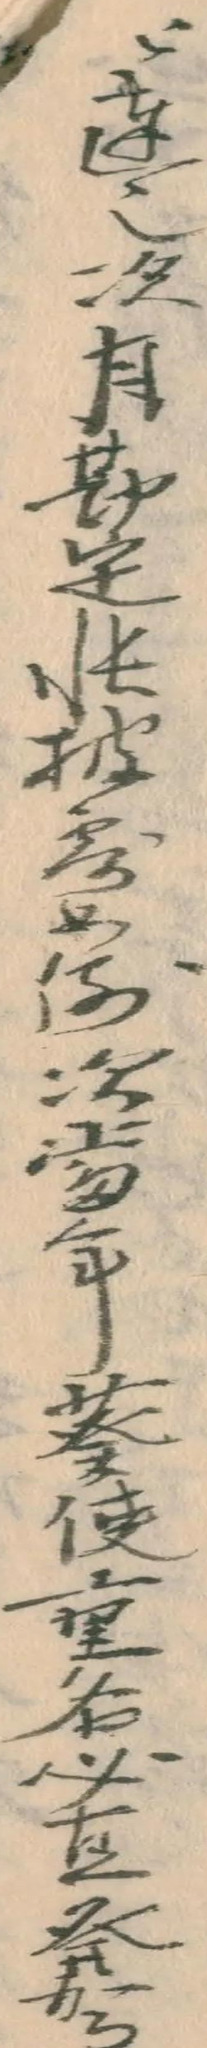被達也次月勘定帳披露如例次當年葵使重名必直発駕
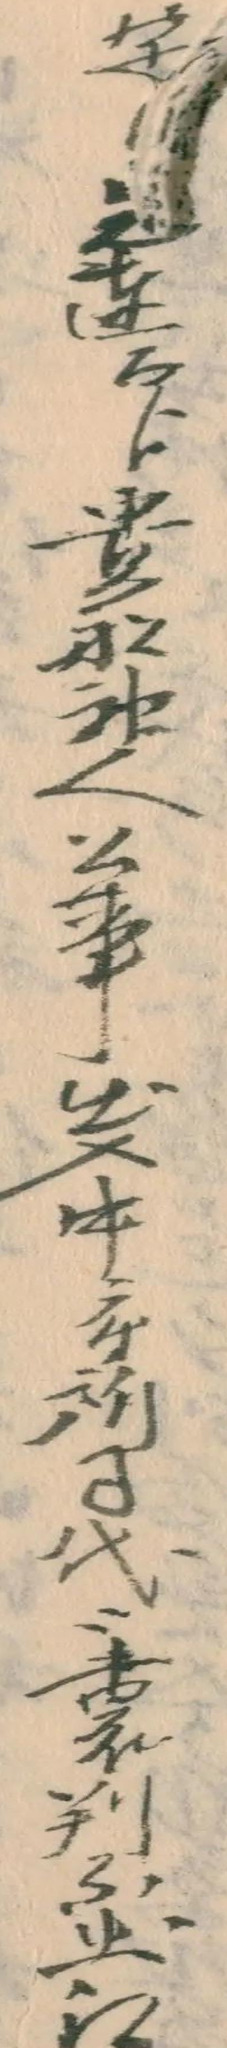定先達而ゟ貴舩神人公事出入中ニ付所司代御裏判不出江
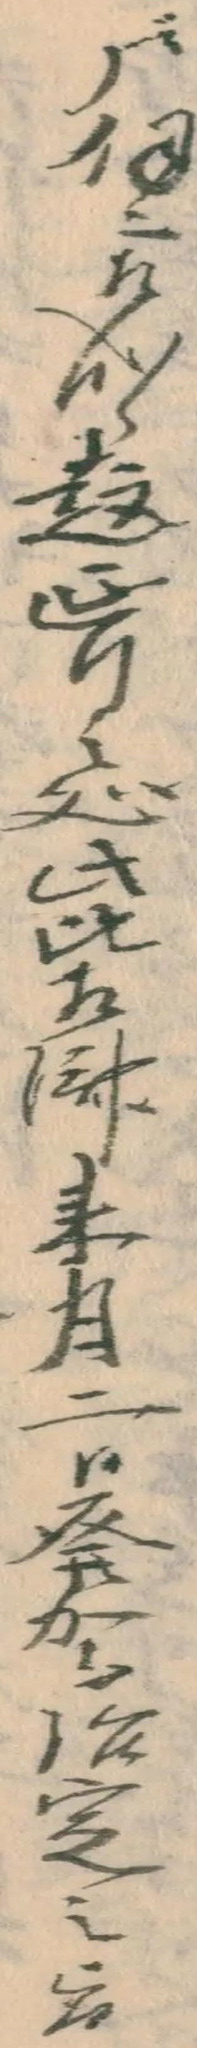戸伺ニ相成候趣延引之処此比相済来月二日登駕治定之旨
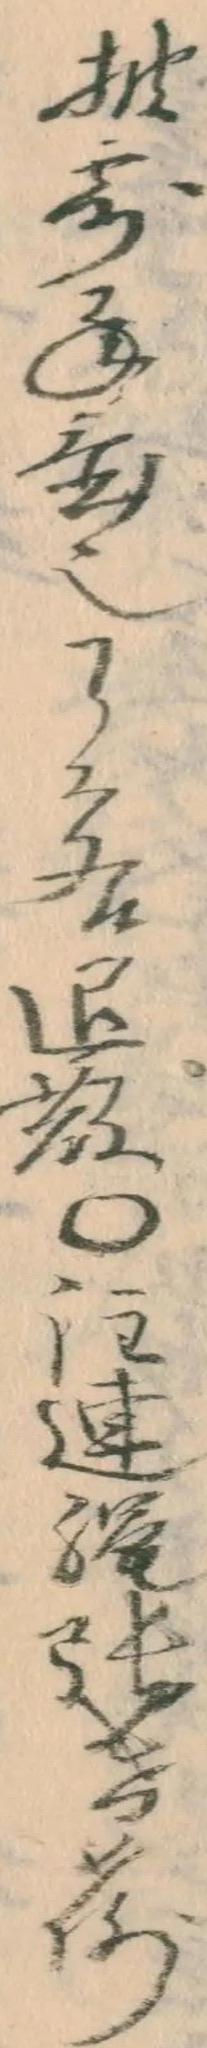披露承置也了而各退散○注連縄張替如例
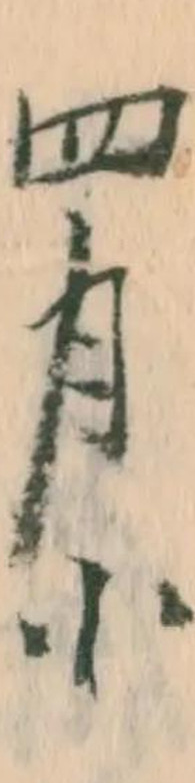四月小
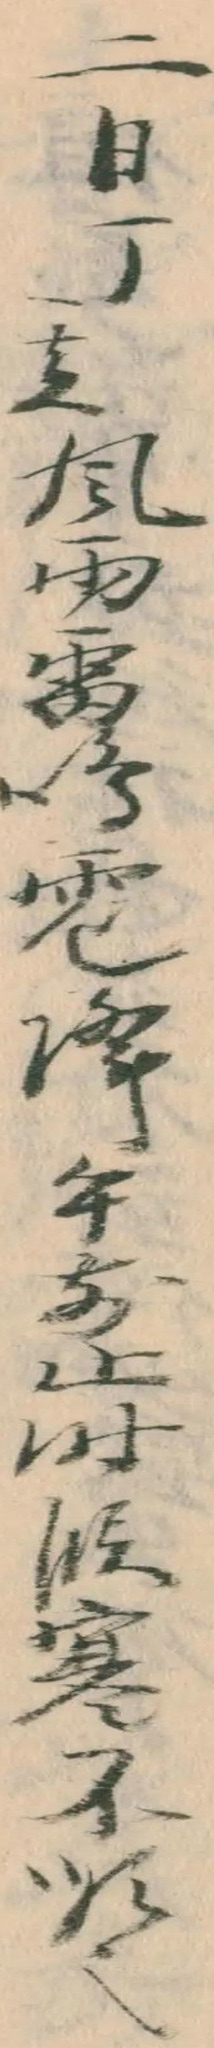二日丁亥風雨雷鳴雹降午前止時候寒不順也
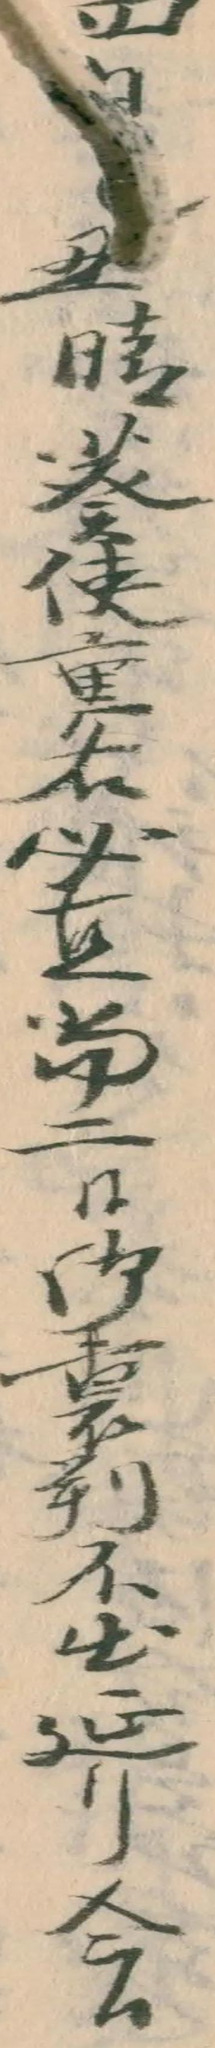四日己丑晴葵使重名必直當二日御裏判不出延引今日
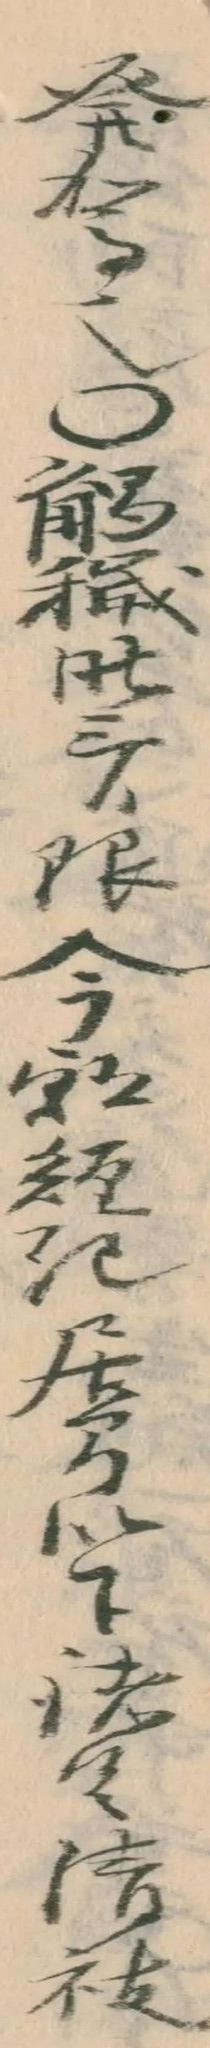発駕也○觸穢昨三日限今朝経紀居間以下諸具清祓
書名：賀茂社記録. 第70冊
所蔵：国立国会図書館 National Diet Library, JAPAN
